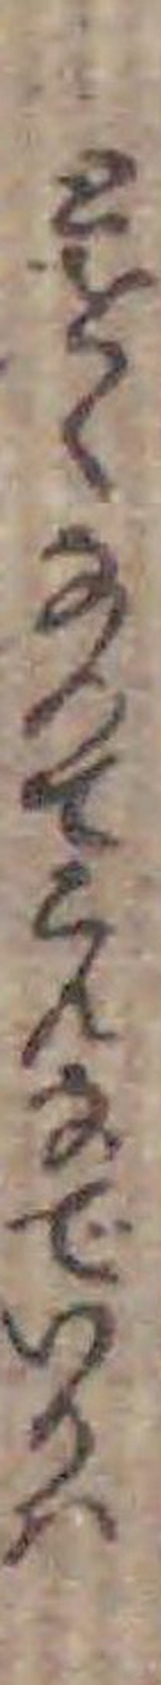とをくなつてこんなでいりは
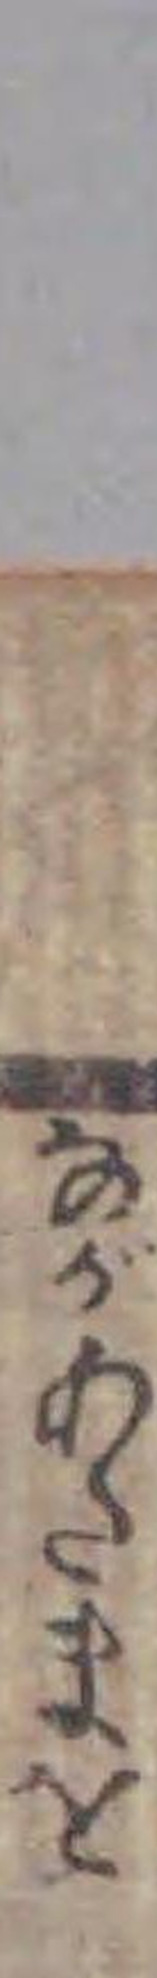ながあたまを
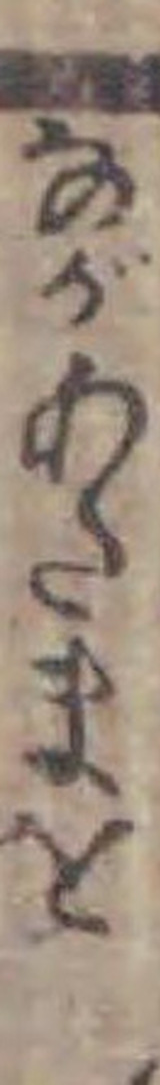ながあたまを
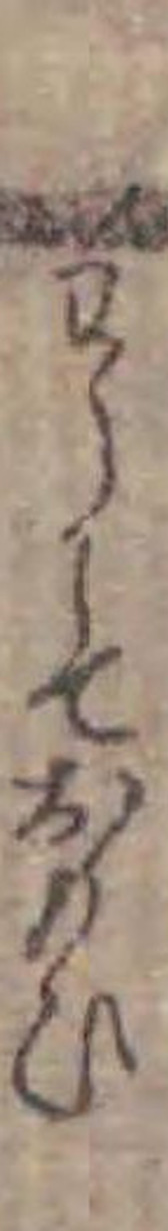わりしておもひ
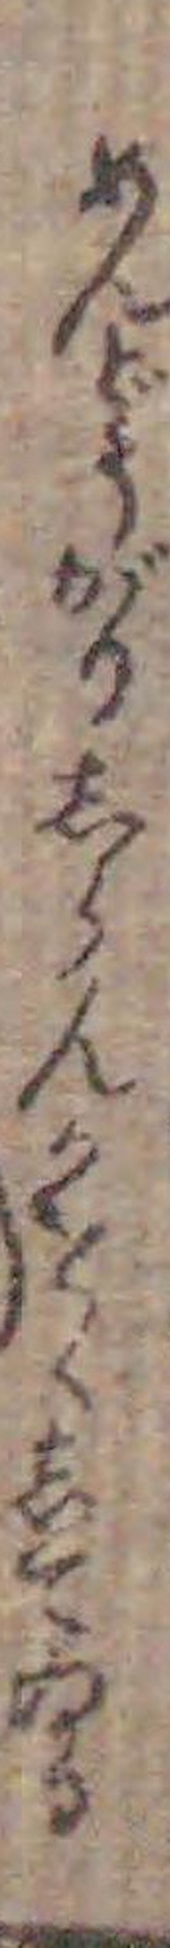めんどうがりしらんかを〳〵してゐる
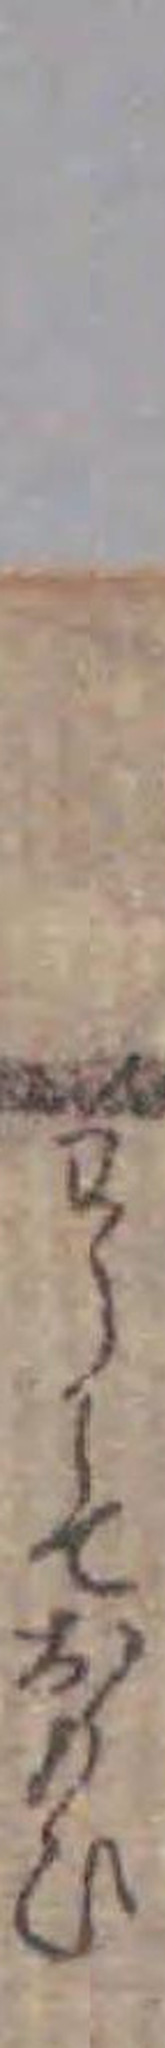わりしておもひ
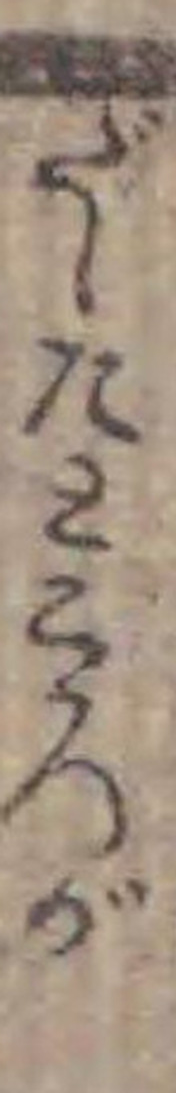だしたところが
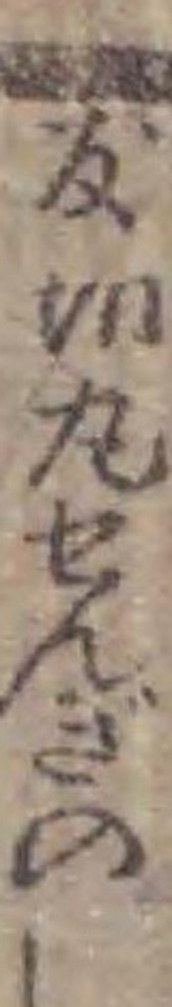友切丸せんぎの
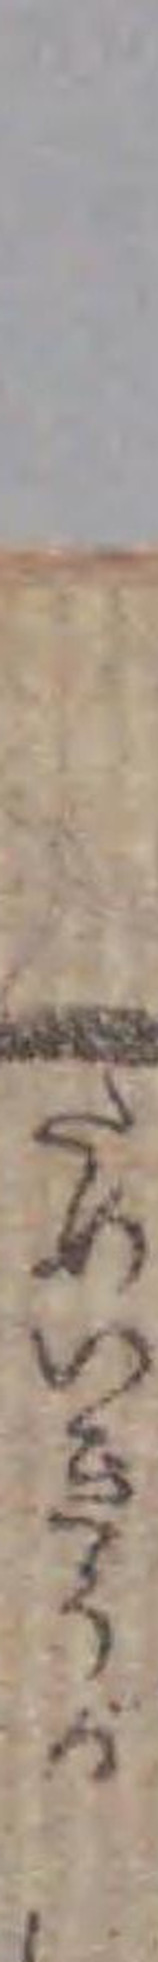ためいきうが
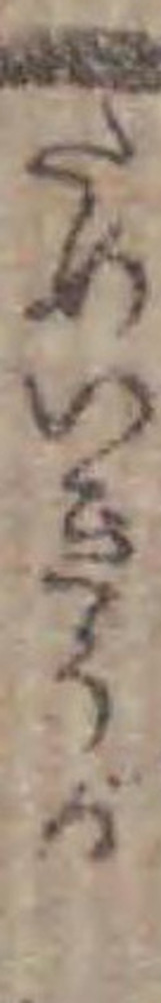ためいきうが
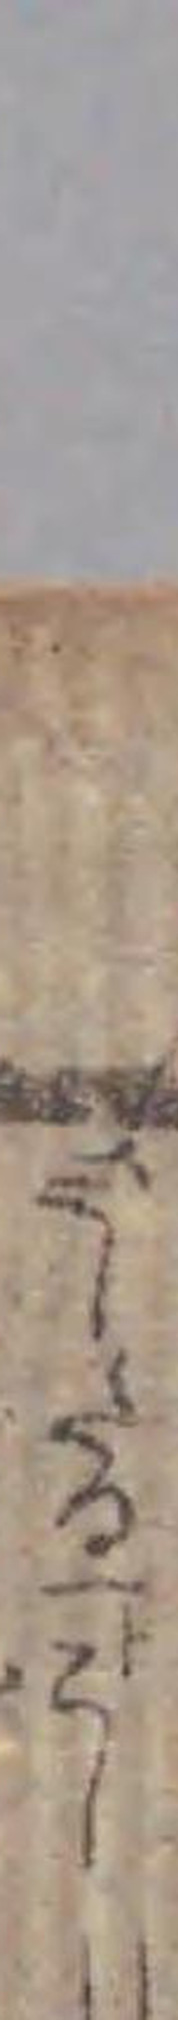さしたる一
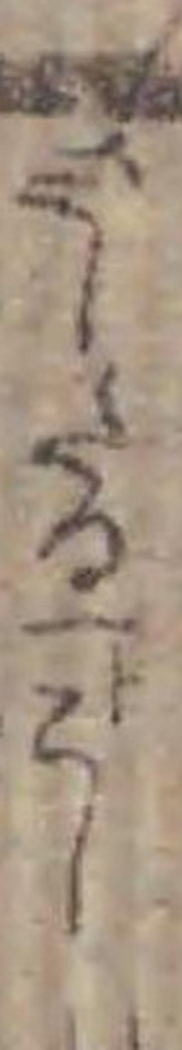さしたる一
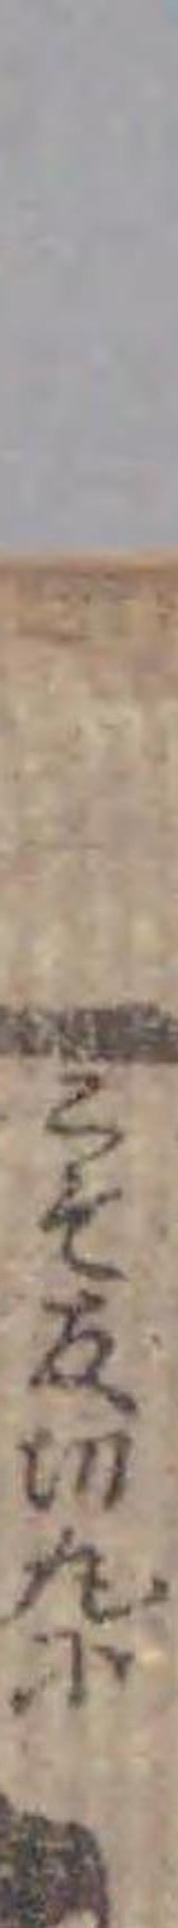こそ友切丸に
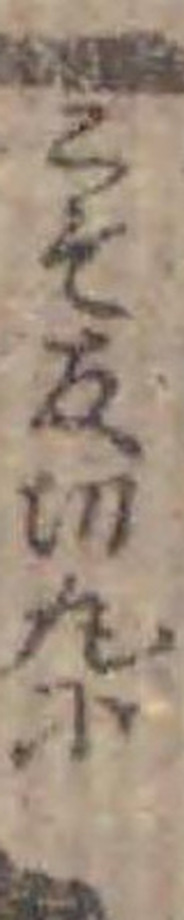こそ友切丸に
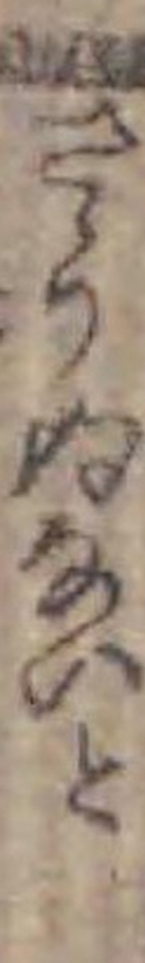さうゐないと
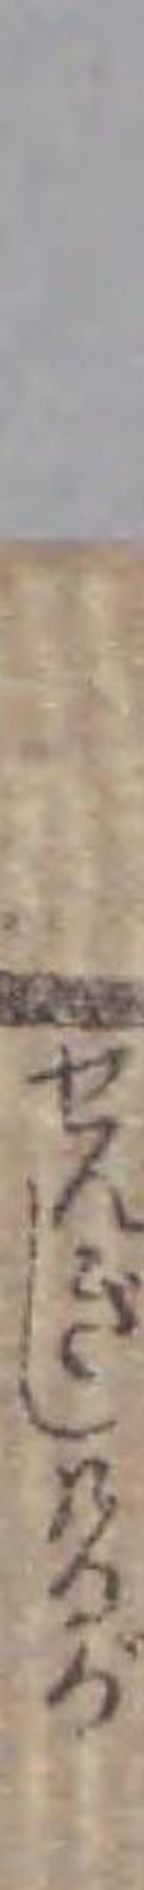せんぎしけるが
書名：年寄之冷水曽我 : 3巻
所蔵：国立国会図書館 National Diet Library, JAPAN
